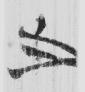之
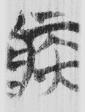疾
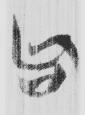句
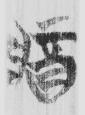𨟻
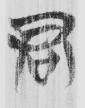君
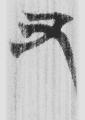又
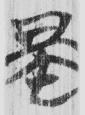{日虫}
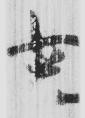才
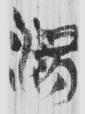湯
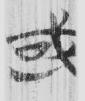或
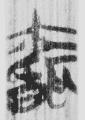{尒䎽}
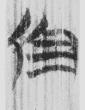於
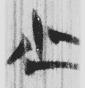少
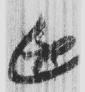臣
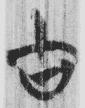古
